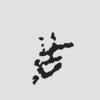居
